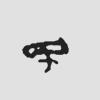民
